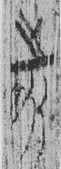之所
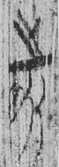所
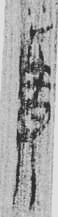貴
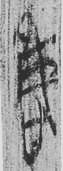唯
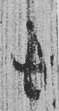心
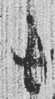心
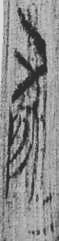之所
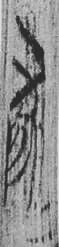所
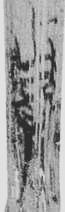貴
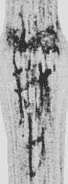唯
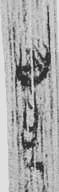○（一）
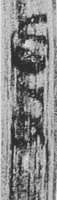○（得）
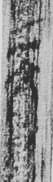而
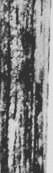解
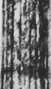之
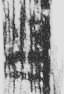上
